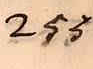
255
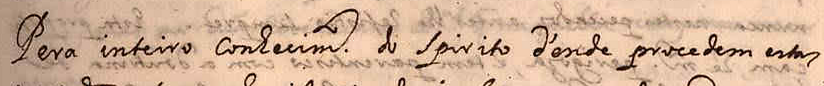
Pera inteiro conhecim.to do spirito d'onde procedem estas
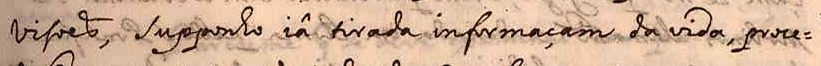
visoẽs, supponho iá tirada informaçam da vida, proce
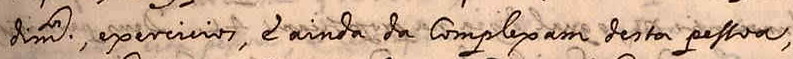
dimto., exercicios, e ainda da Complexam desta pessoa,
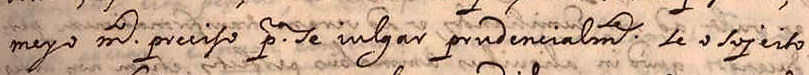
meyo mto. preciso p.ra se iulgar prudencialmte se o sojeito
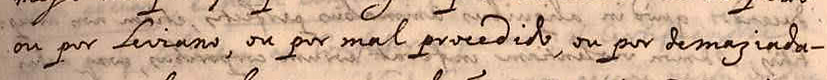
ou por Leviano, ou por mal procedido, ou por demaziada
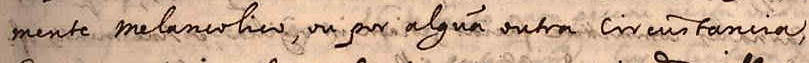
mente melancolico, ou por alguā outra circūstancia,
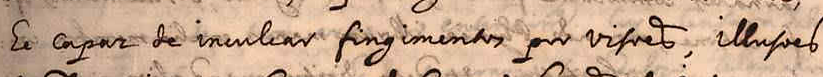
he capaz de inculcar fingimentos por visoẽs, illusoẽs
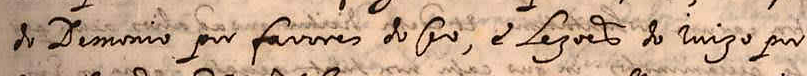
do Demonio por favores do Ceo, e Lezoẽs do iuizo por
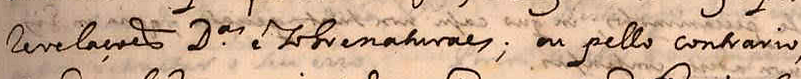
Revelaçoẽs D.as e sobrenaturaes; ou pello contrario,
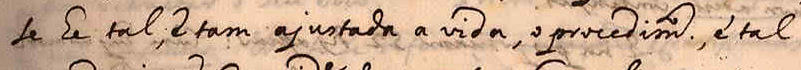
se he tal, e tam ajustada a vida, o procedimto, e tal
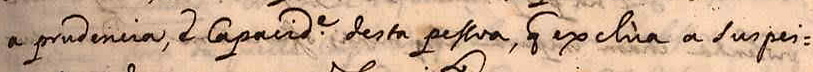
a prudencia, e Capacid.e desta pessoa, q̄ exclua a suspei
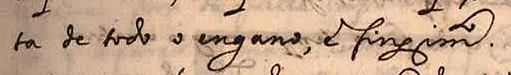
ta de todo o engano, e fingimto.
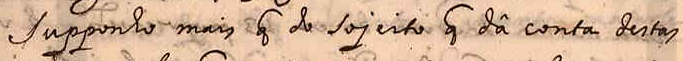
Supponho mais q̄ do sojeito q̄ dâ conta destas
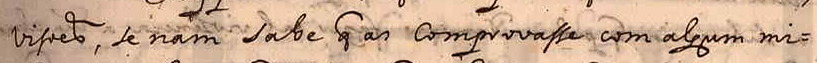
visoẽs, se nam sabe q̄ as comprovasse com algum mi
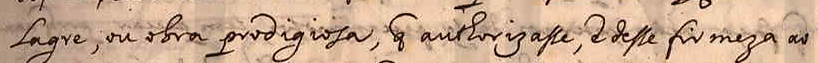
Lagre, ou obra prodigiosa, q̄ authorizasse, e desse firmeza ao
